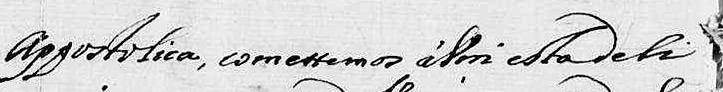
appostolica, comettemos à V m esta deli
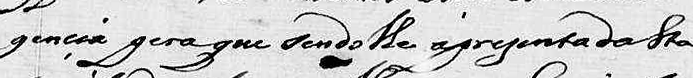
gencia pera que sendolhe aprezentada esta
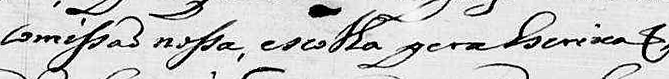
comissaõ nossa, escolha pera Escriuaõ
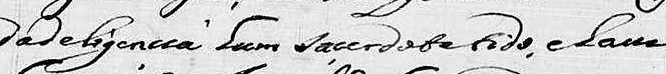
da deligencia hum sacerdote tido, e haui
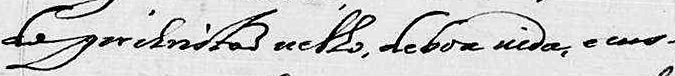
do por christaõ uelho, de boa uida, e cus
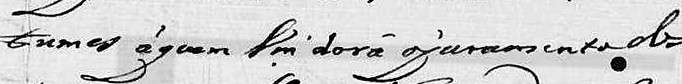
tumes à quem V m dará o juramento dos
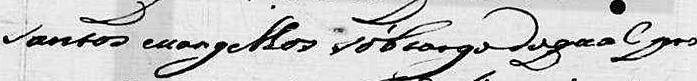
santos euangelhos sob cargo do qual pro
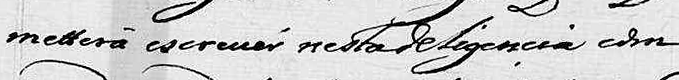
mettera escreuer nesta deligencia com
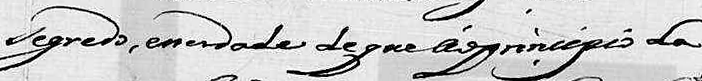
segredo, e uerdade de que ao principio da
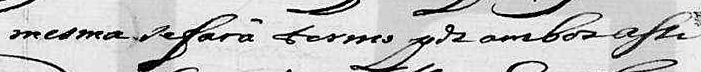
mesma se fará termo por ambos assi
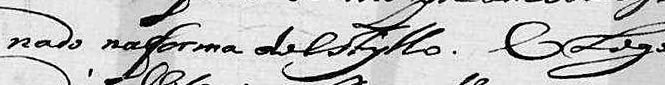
nado na forma do estyllo. E Logo
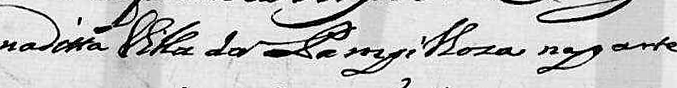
na ditta Villa da Pampilhoza na parte
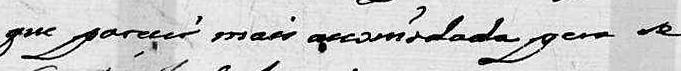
que parecer mais accom̄odada pera se
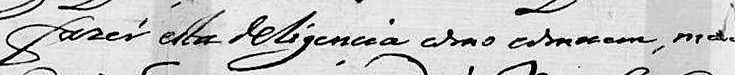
fazer esta deligencia como comuem, ma
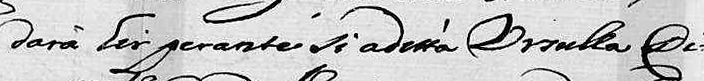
dará hir perante si a ditta Vrsulla Di
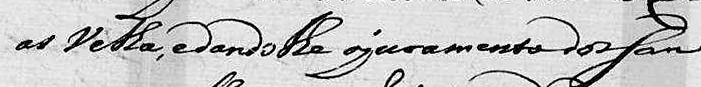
as Velha, e dandolhe o juramento dos san
